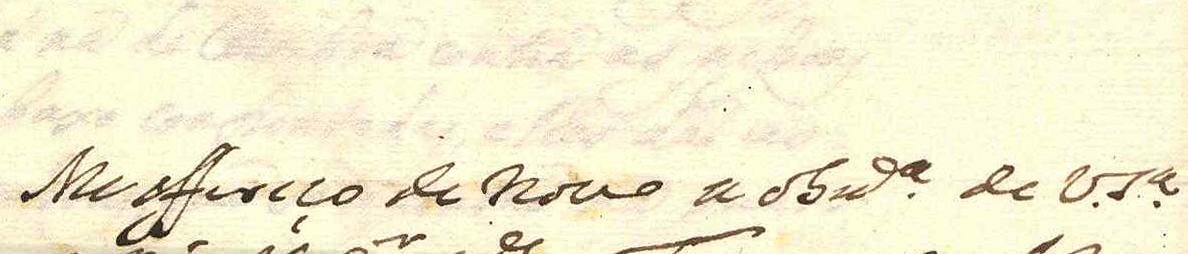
Me offereço de nouo a obu.a de V. S.a
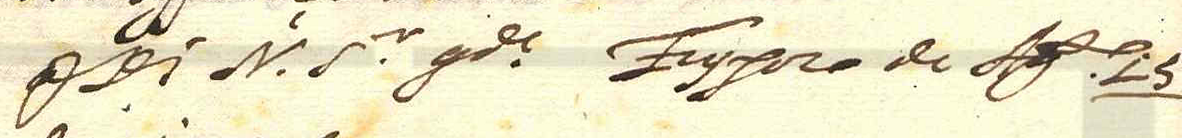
q̄ Ds̄ N. s.or gd.e Teyxozo de Ag.to i5
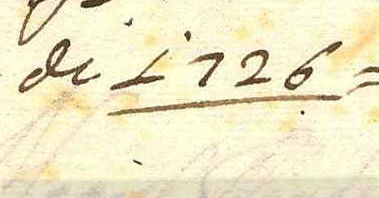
de i726
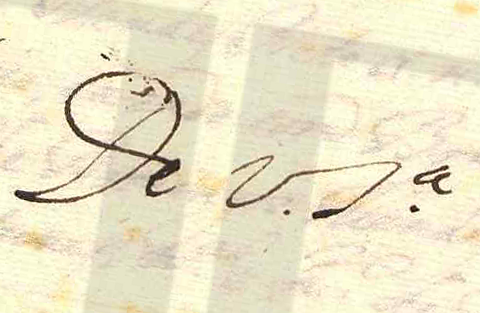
De V. S.a
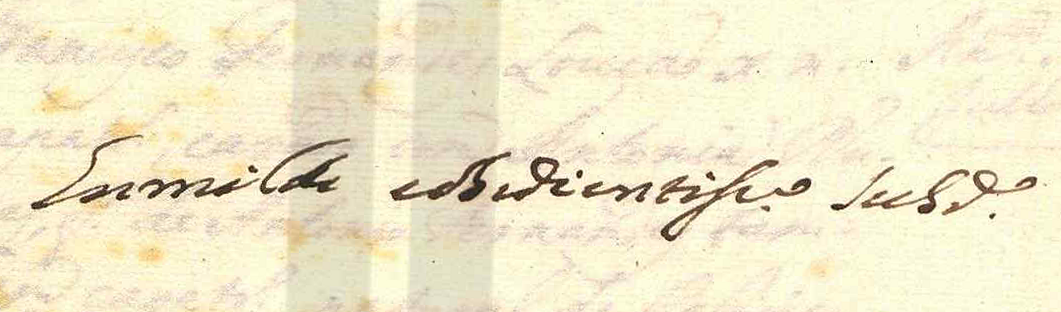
humilde e obedientiss.o subd.o
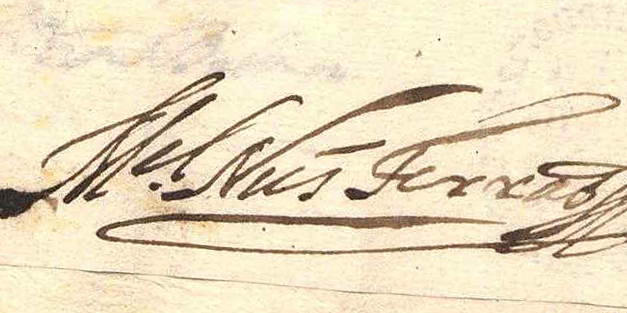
M.el Nus̄ Ferraõ
